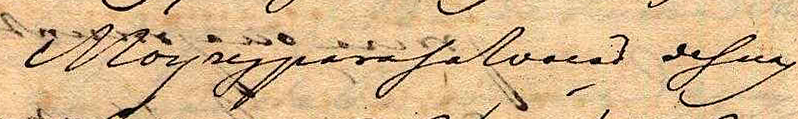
Moyzes para salvaçaõ de suas
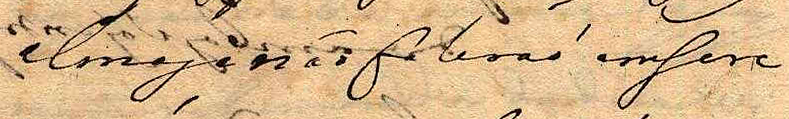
almas e naõ falaraõ em sere
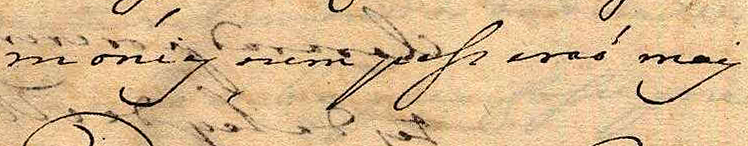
monias nem passaraõ mais
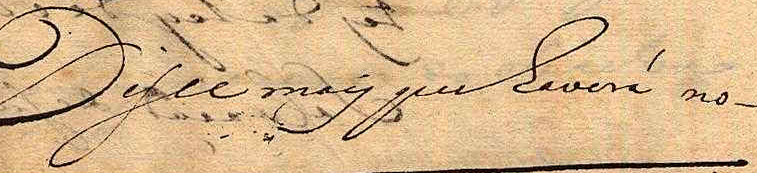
Disse mais que haverá no
